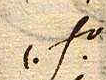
1. f.o
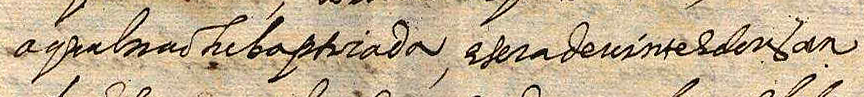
a qual naõ he baptizada, E sera de uinte E dous an
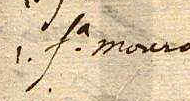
1. f.a moura
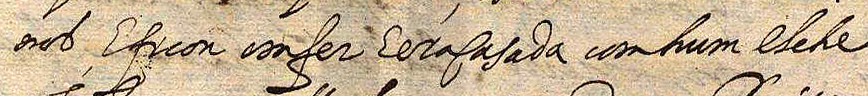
nos, E ficou em fez E era Casada com hum Elche
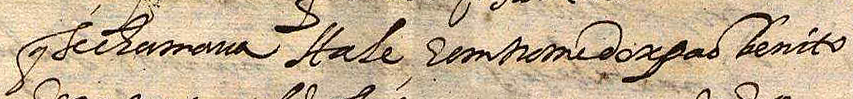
q̄ se chamaua Hale, E em nome de xpaõ benito
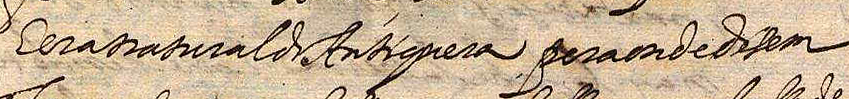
E era natural de Antiquera, pera onde disem
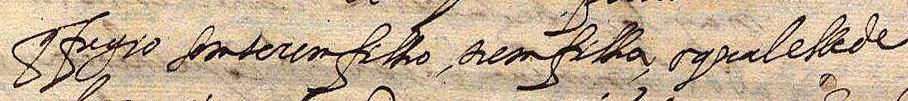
q̄ fugio sem terem filho, nem filha, o qual elle de
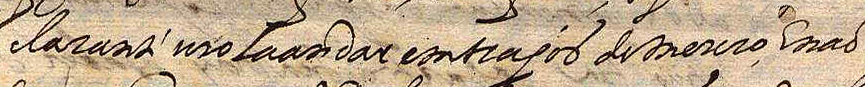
clarante uio la andar em trajos de mouro, E naõ
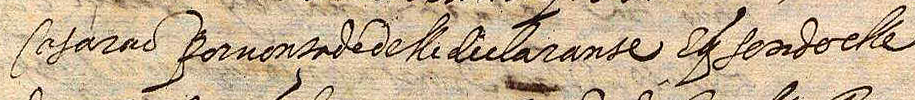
Casaraõ por uontade delle declarante E q̄ sendo elle
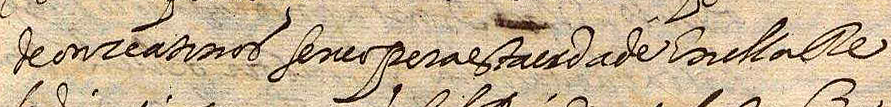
de onze annos se ueo pera esta cidade E nella Re
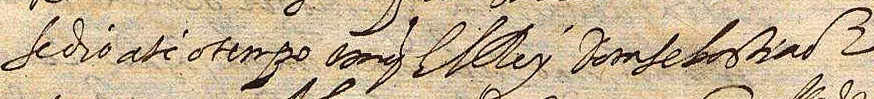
sedio ate o tempo em q̄ El Rey Dom Sebastiaõ
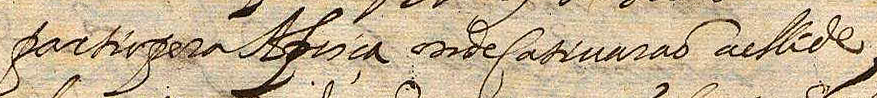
partio pera Africa onde Catiuaraõ a elle de
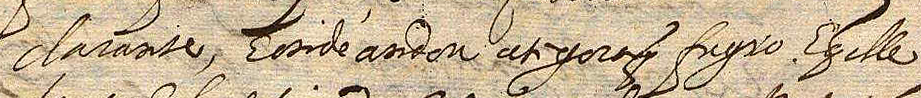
clarante, E onde andou ate gora q̄ fugio. E q̄ elle
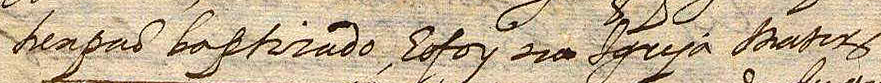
he xpaõ baptizado, E o foy na Igreja Matris
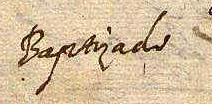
Baptizado
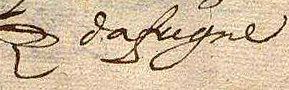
da fregue
